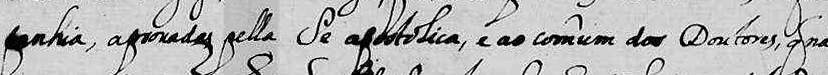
panhia, aprouadas pella Se apostolica, e ao com̄um dos Doutores, q̄ na
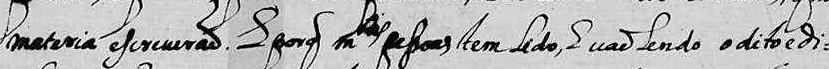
materia escreueraõ. E porq̄ mtas pessoas tem lido, E uaõ lendo o dito edi
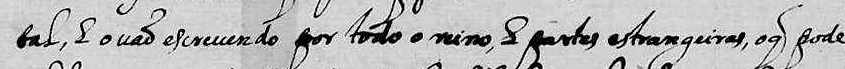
tal, E o uaõ escreuendo por todo o reino, E partes estrangeiras, o q̄ pode
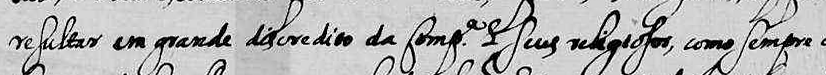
resultar em grande discredito da Comp.a E seus religiosos, como Sempre o
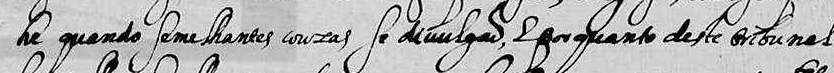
he quando semelhantes couzas se deuulgaõ, E porquanto deste tribunal
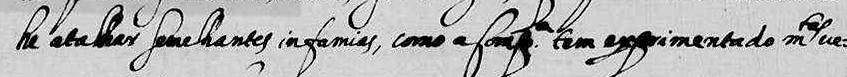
he atalhar semelhantes infamias, como a Comp.a tem exprimentado mtas ue
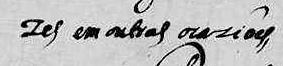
zes em outras ocazioẽs
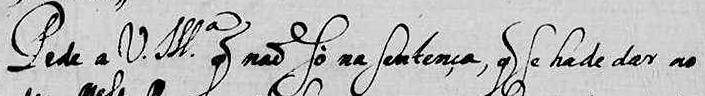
Pede a V. Ill.a q̄ naõ Só na Sentença, q̄ Se ha de dar ao
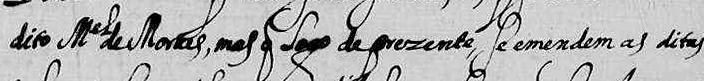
dito Mel de Moraes, mas q̄ logo de prezente, se emendem as ditas
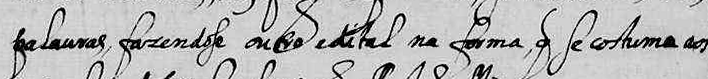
palauras, fazendose outro edital na forma, q̄ Se costuma aos
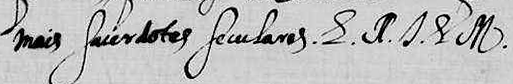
mais Sacerdotes Seculares. E. R. S. I. E M.
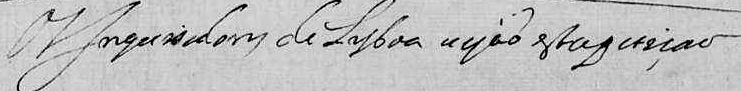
Os Jnquisidores de Lisboa uejaõ esta petiçaõ
